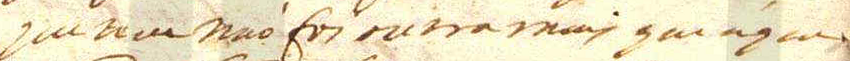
que tem naõ foi outra mais que a que
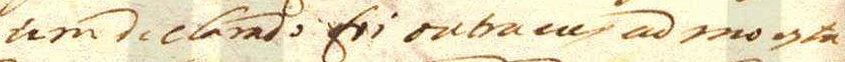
tem declarado foi outra uez admoesta
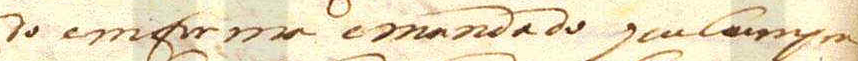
do em forma e mandado que Cumpra
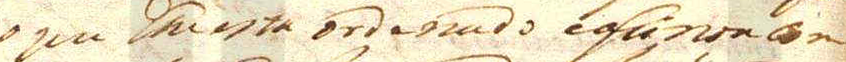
o que lhe esta ordenado e assinou com
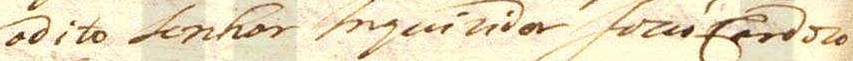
o dito senhor Inquizidor Joaõ Cardozo
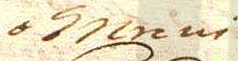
o Escreui
